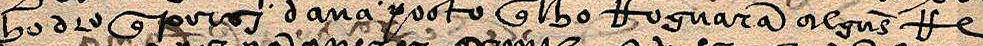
ho dro q̄ por sj daua posto q̄ lho Roguarā algus̄ Re
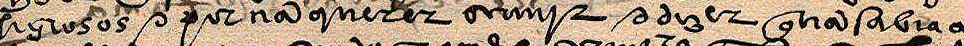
ligiosos e por nā querer seruijr e dizer q̄ nā sabiaa
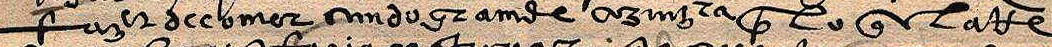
fazer de comer semdo gramde cozinhra p̄lo q̄ ela Re
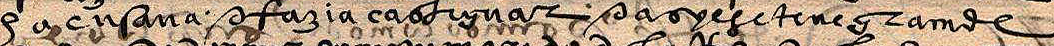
ha cusaua e fazia castiguar e asy lhe teue gramde
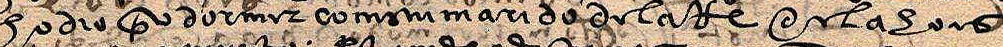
hodio p̄o dormir com seu marido dela Re e ela ho es
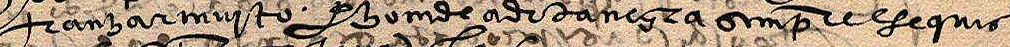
tranhar mujto ꝑ homde a dita negra sempre lhe quis
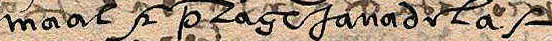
maal e prageJaua dela /-
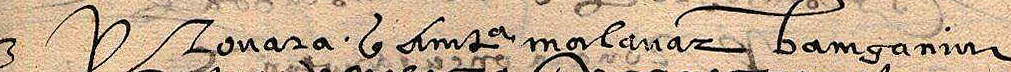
Prouara q̄ Amta malauar bamganim
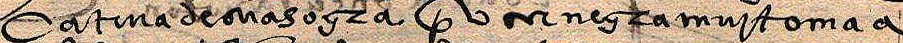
Catiua de sua sogra p̄o ser negra mujto maa
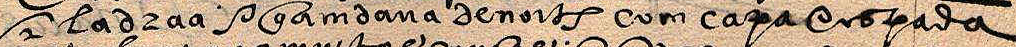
e ladraa e q̄ amdaua de noitꝭ com capa e espada
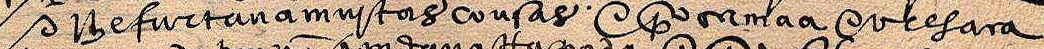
e lhe furtaua mujtas cousas e p̄o ser maa e velhaca
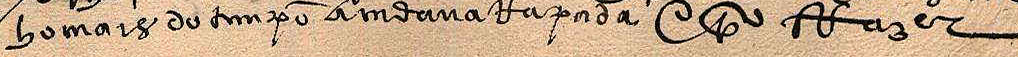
ho mais do tempo amdaua Rapada e p̄o ffazer
